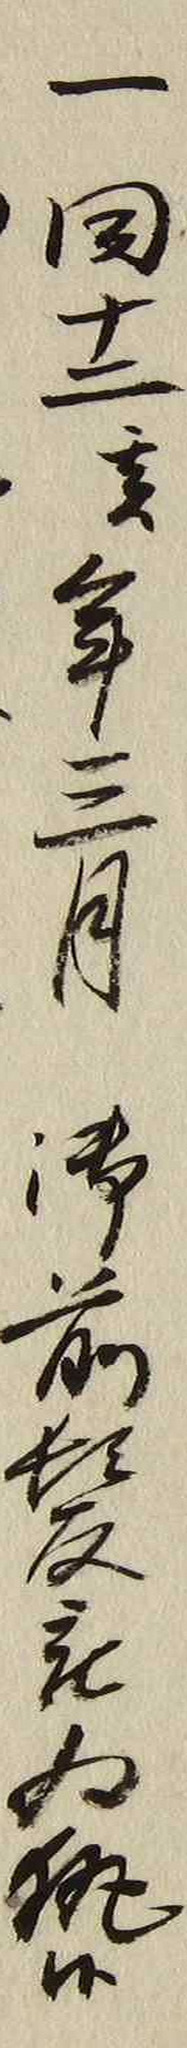一同十二亥年三月御前髪被為執候
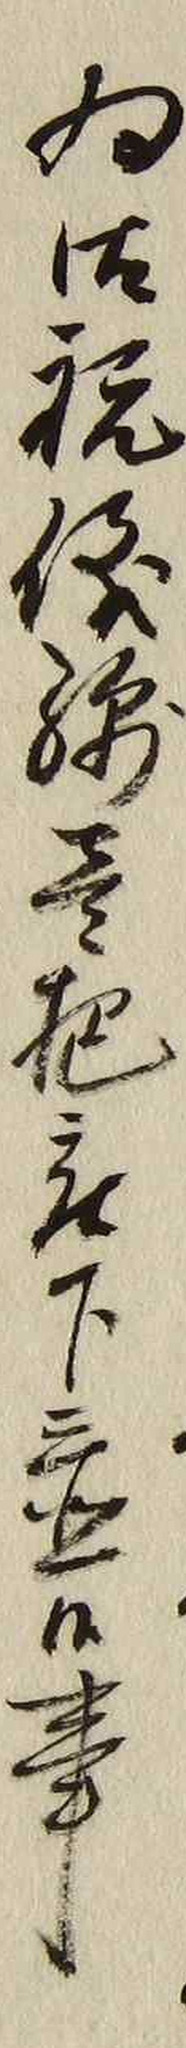為御祝儀綿壱把被下置候事
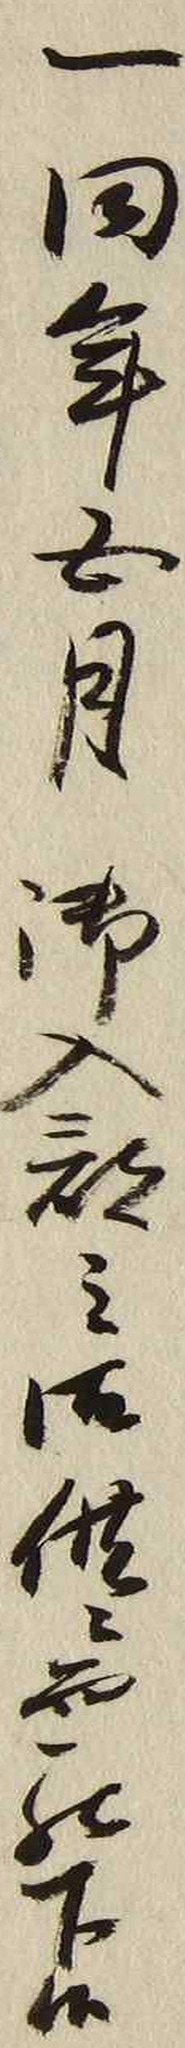一同年五月御入部之御供ニ而罷下候
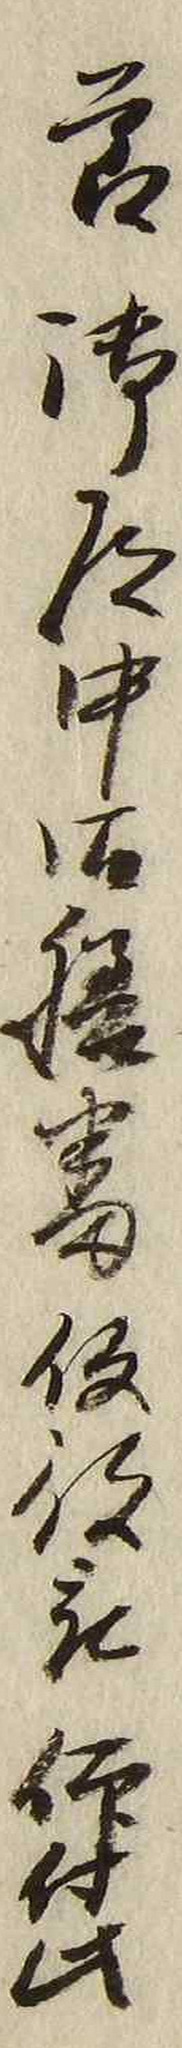節御道中御膳番仮役被仰付此

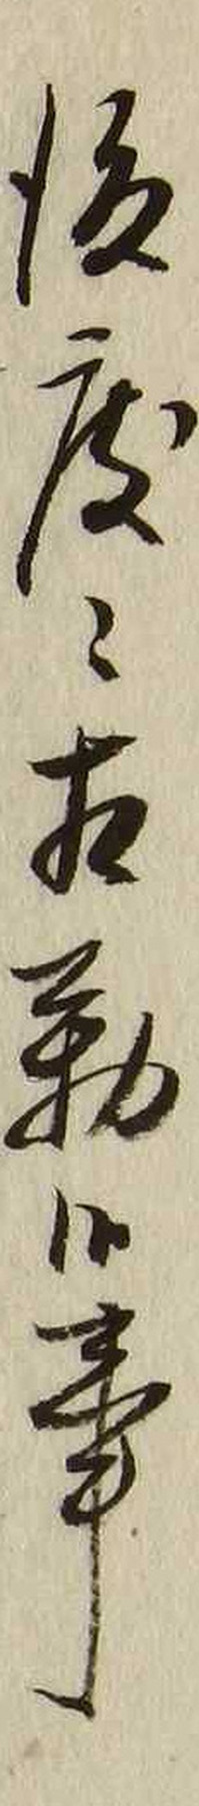後度々相勤候事
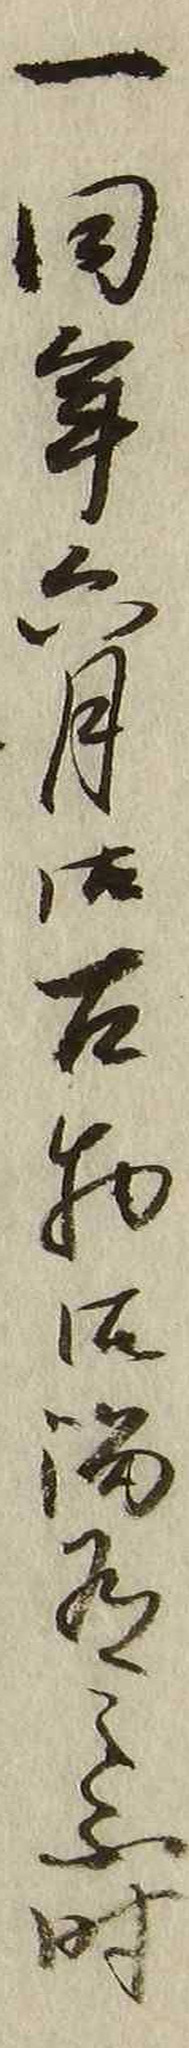一同年六月御召物御溜有之不時
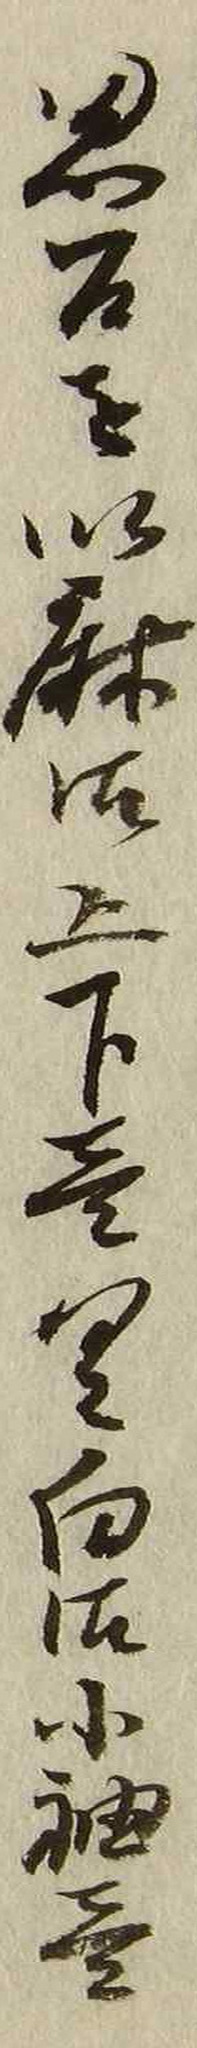思召を以麻御上下壱具白御小袖壱
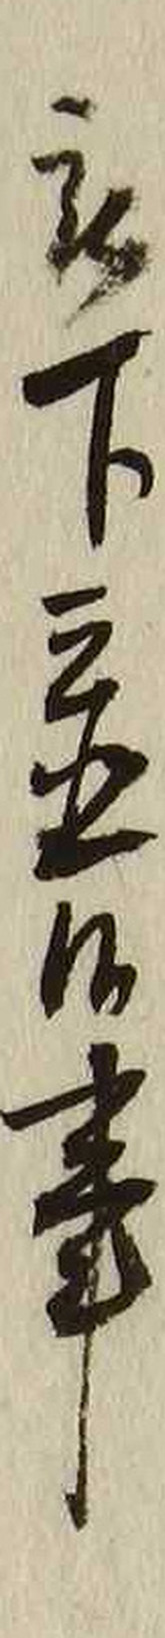被下置候事
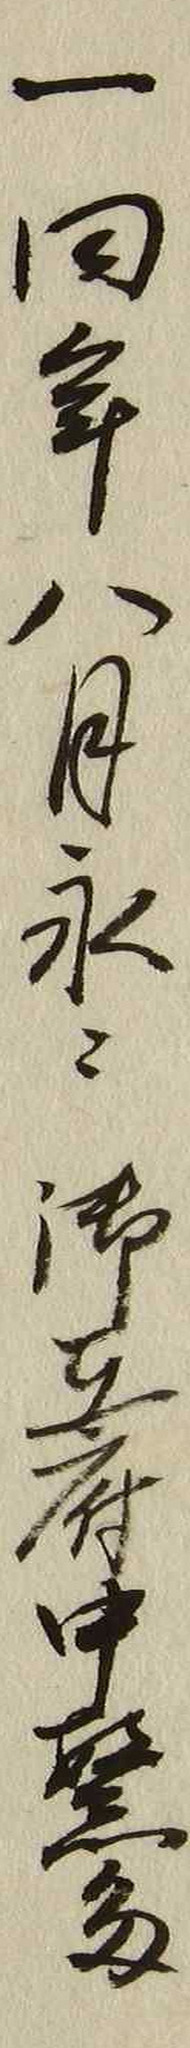一同年八月永々御在府中繁多
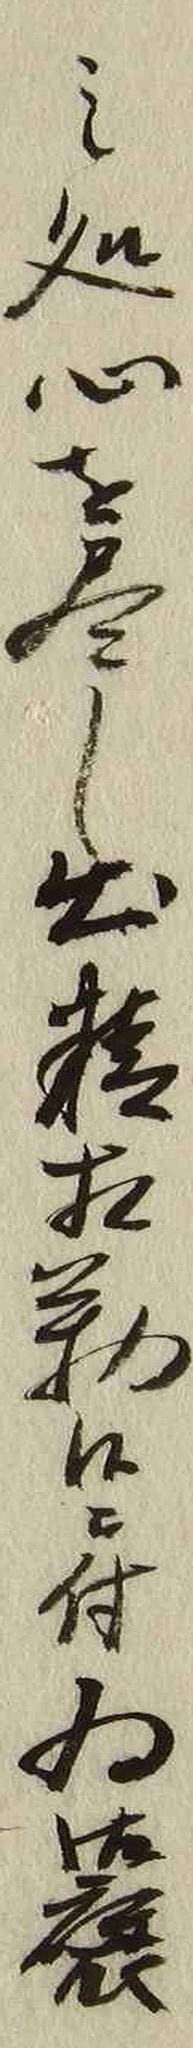之処心を尽し出精相勤候ニ付為御褒
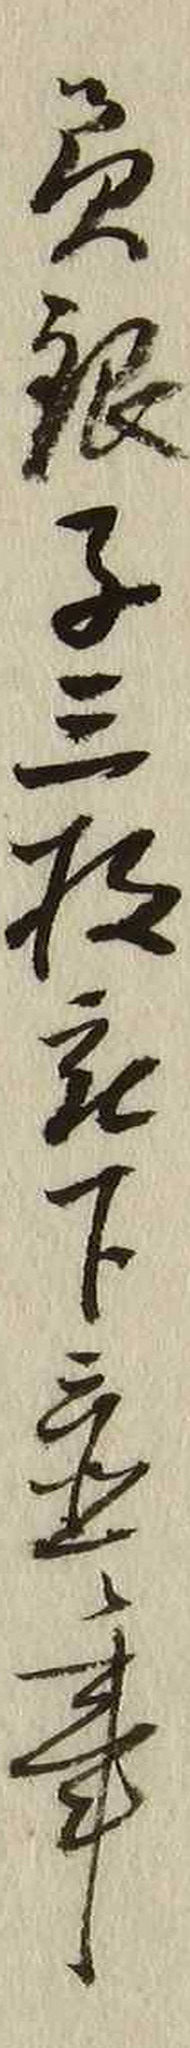美銀子三枚被下置候事
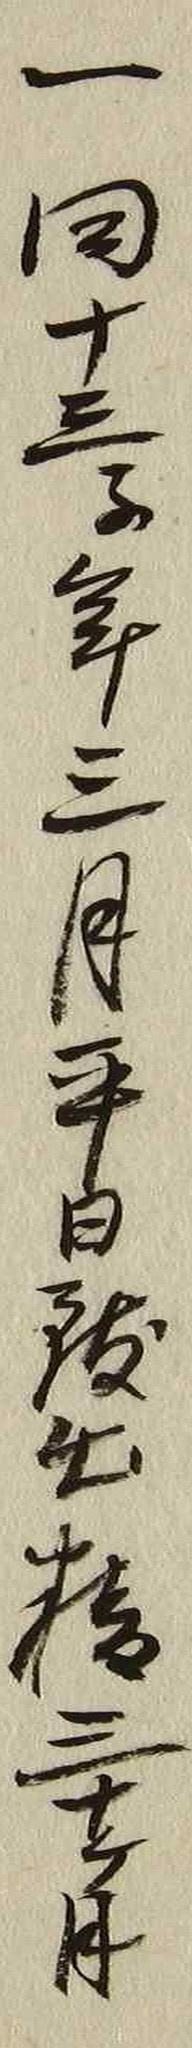一同十三子年三月平日致出精三十ケ月
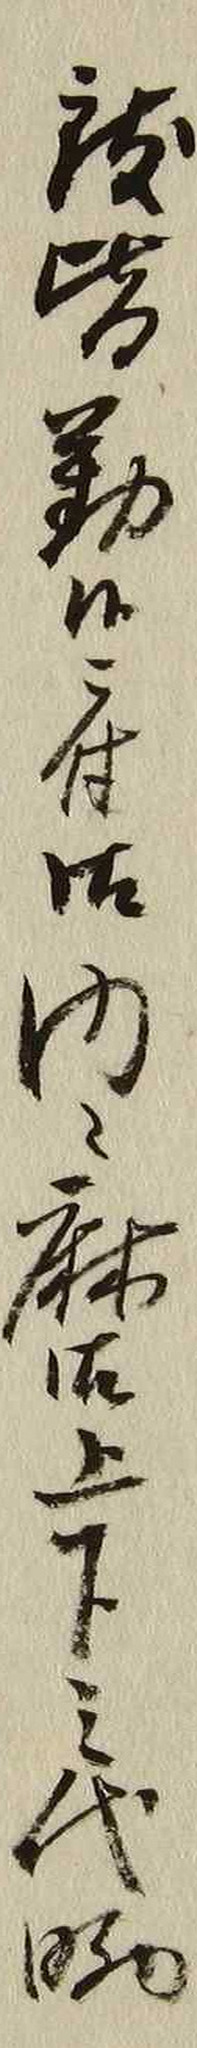致皆勤候ニ付御内々麻御上下之代晒
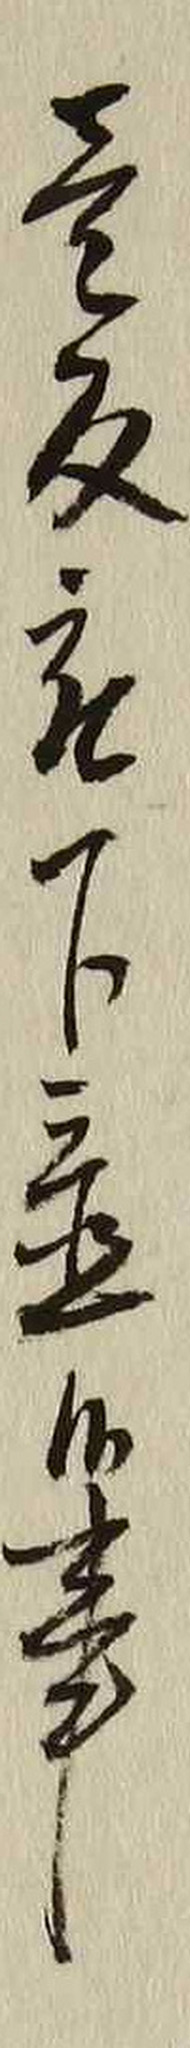壱反被下置候事
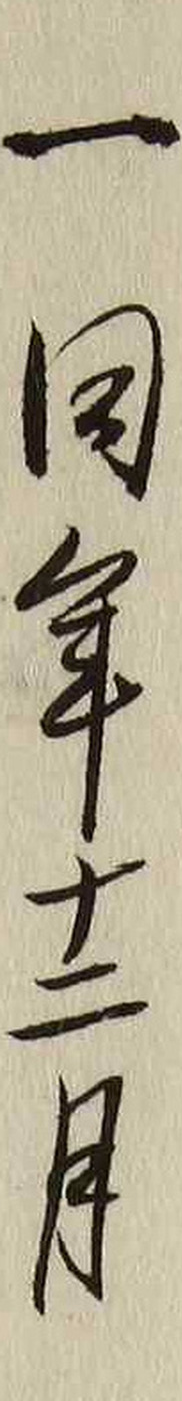一同年十二月
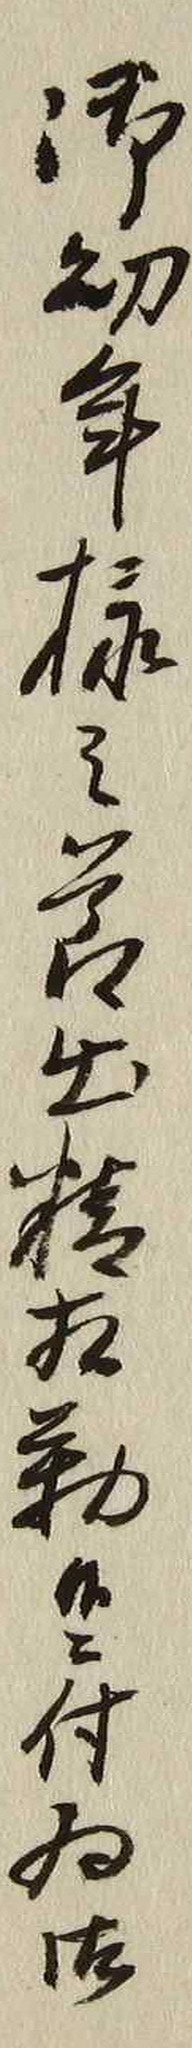御幼年様之節出精相勤候ニ付為御
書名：諸士系譜　巻之356　す之部6
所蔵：会津若松市立会津図書館
